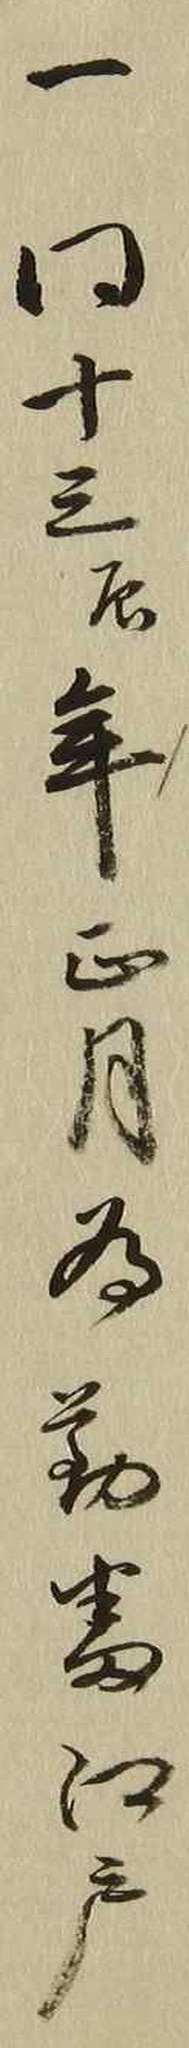一同十三辰年正月為勤番江戸
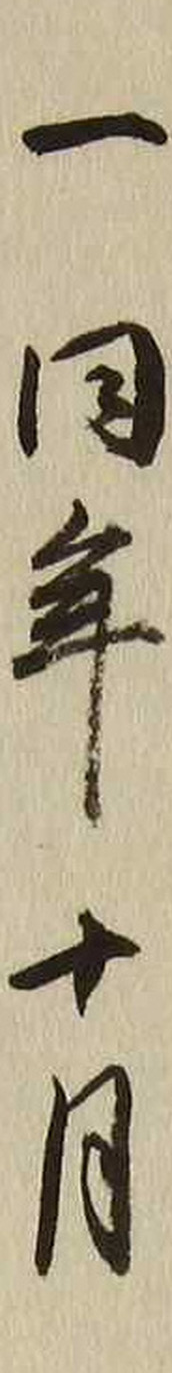一同年十月
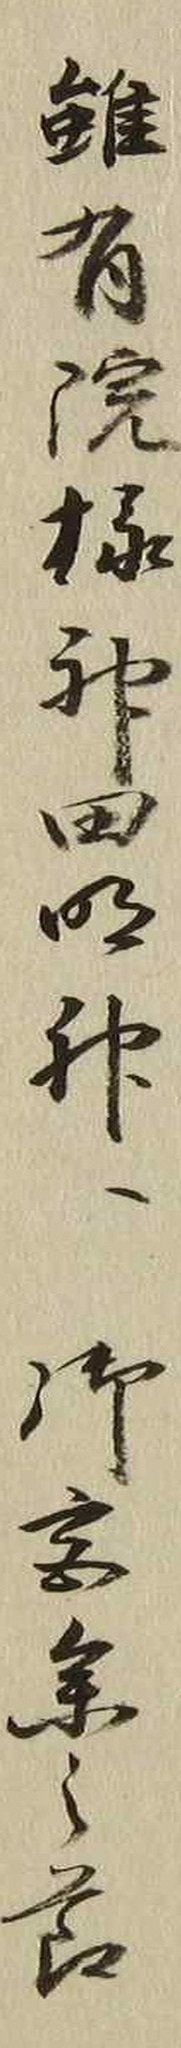雖有院様神田明神へ御宮参之節
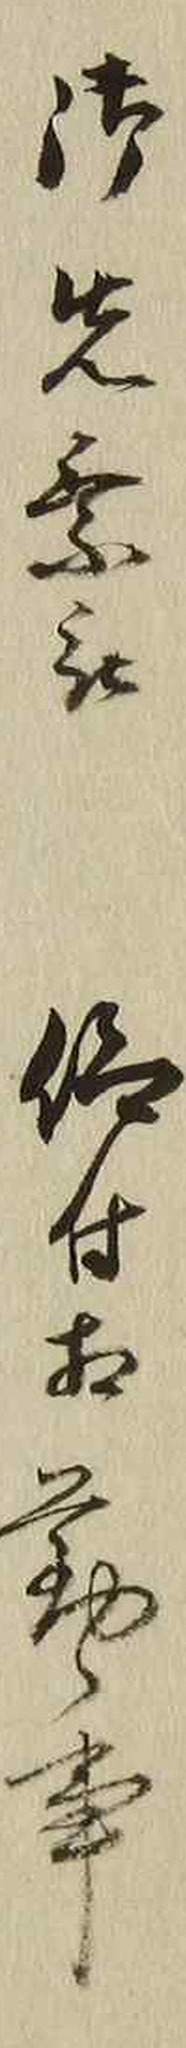御先乗被仰付相勤候事
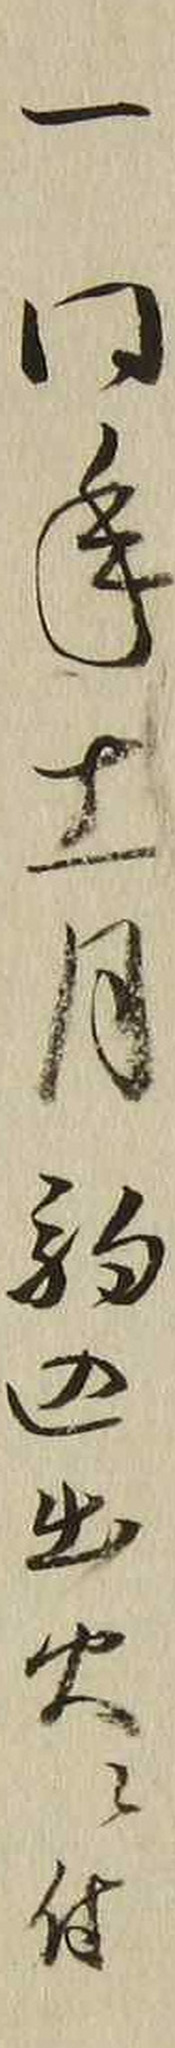一同年十一月駒込出火ニ付
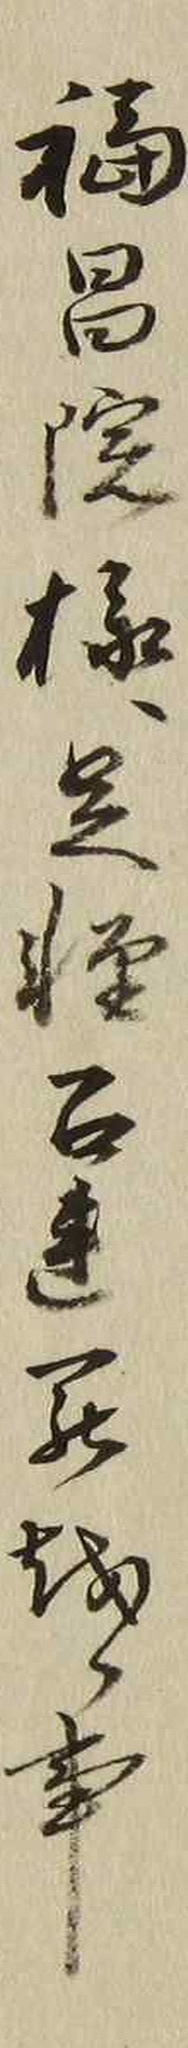福昌院様へ足軽召連罷越候事
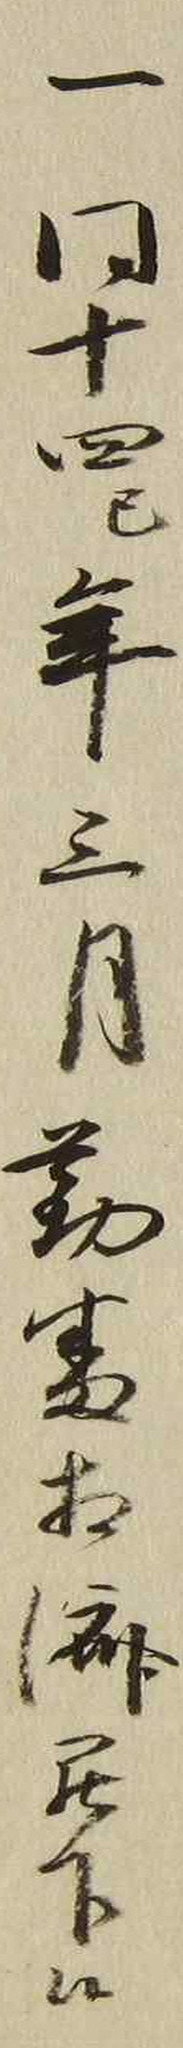一同十四巳年三月勤番相済罷下候
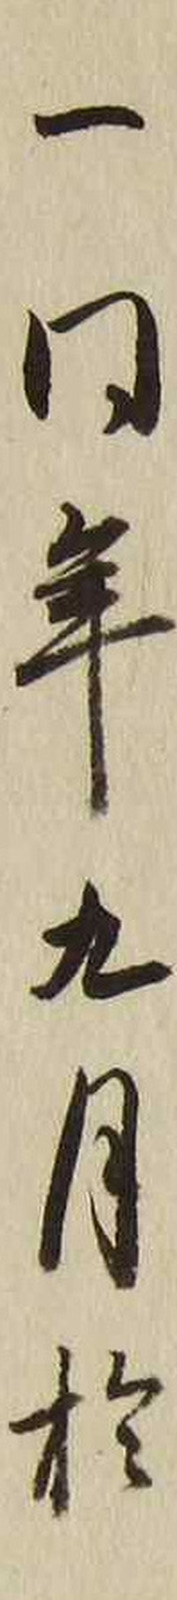一同年十月
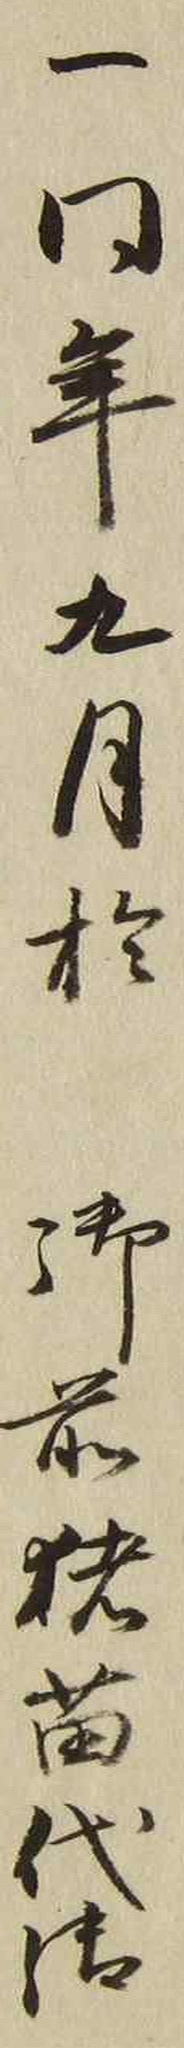一同年九月於御前猪苗代御
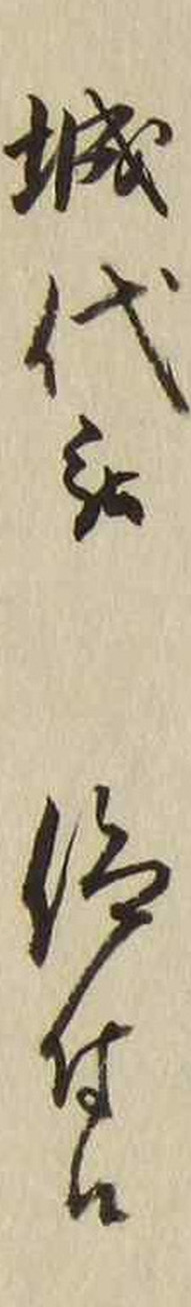城代被仰付候

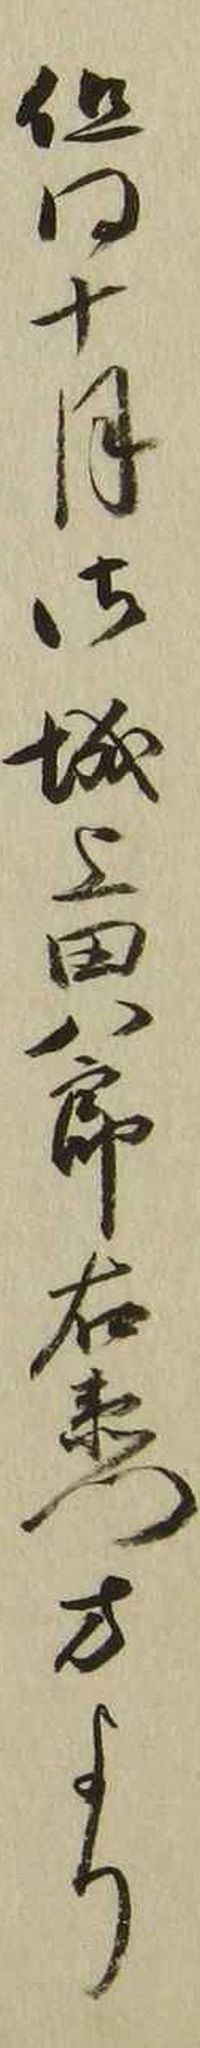但同十月御城上田八郎右衛門方より
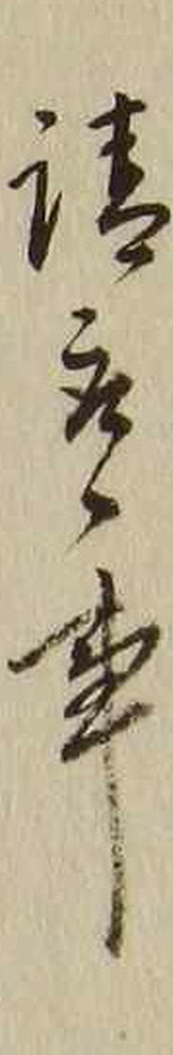請取候事
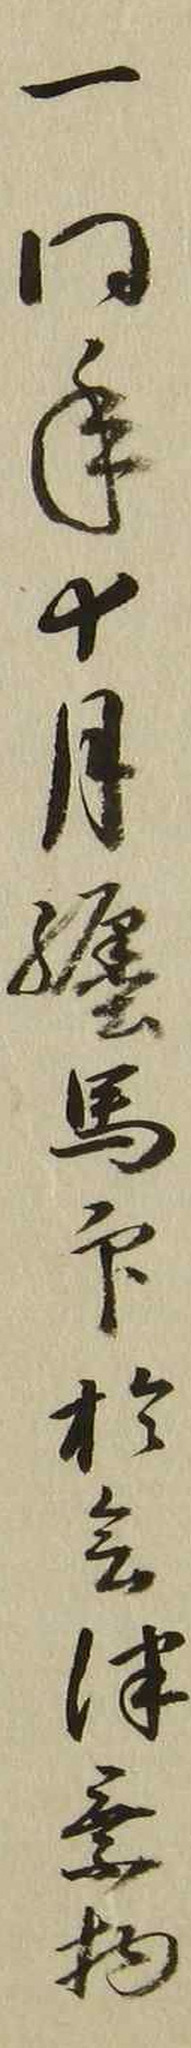一同年十月纏馬印於会津乗物
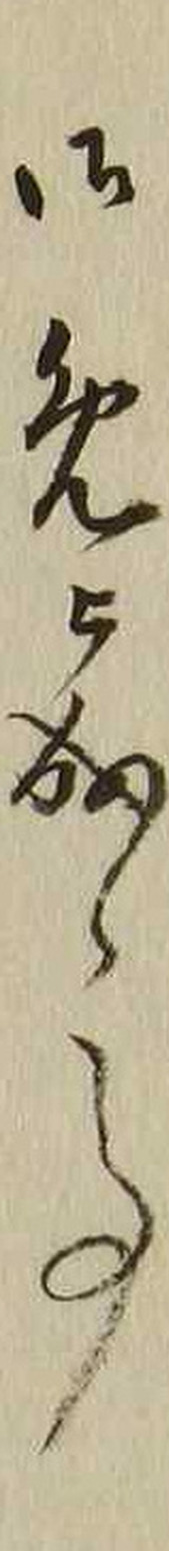御免被成候事
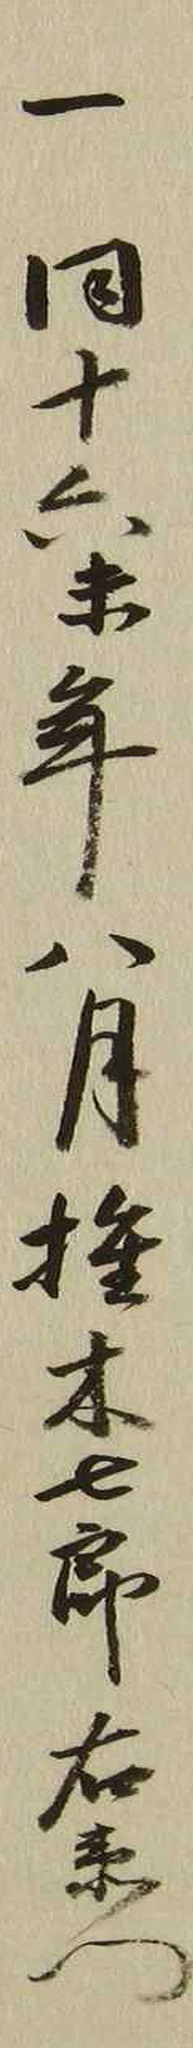一同十六未年八月推木七郎右衛門
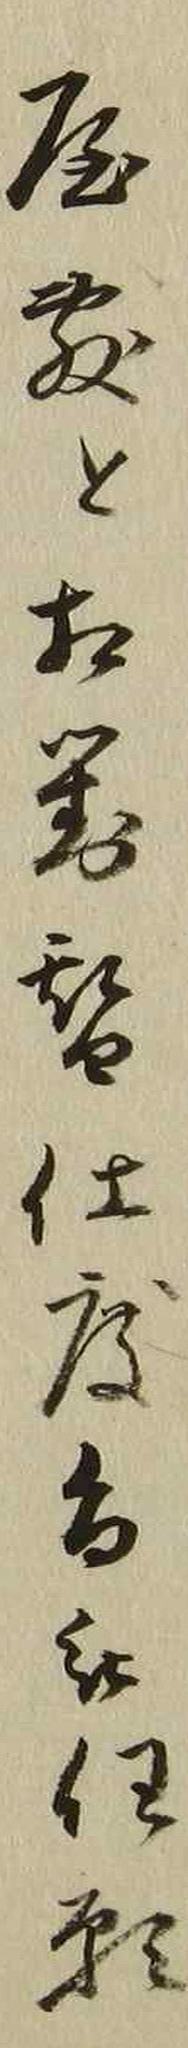屋敷と相対替仕度旨被任願
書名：諸士系譜　巻之69　を之部3
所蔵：会津若松市立会津図書館
